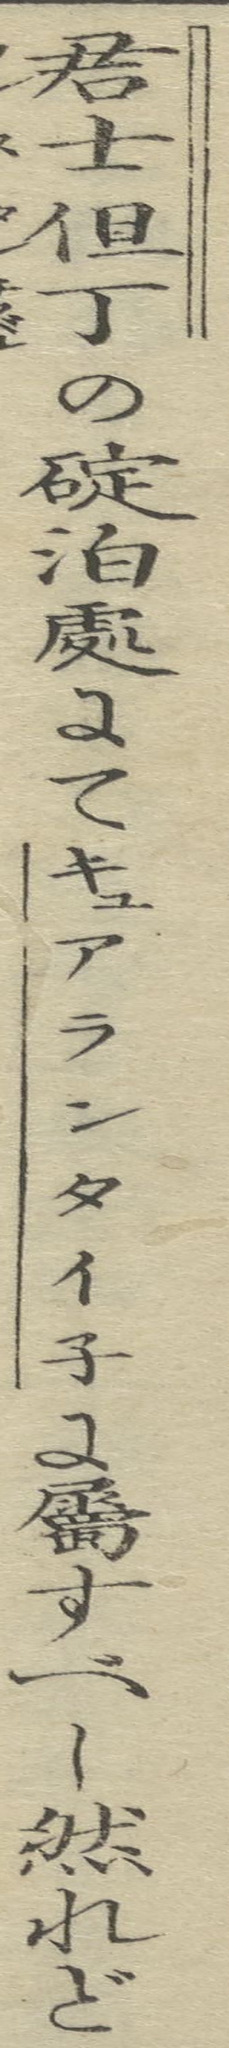君士但丁の碇泊處にてキュアランタイネに屬すべし然れど
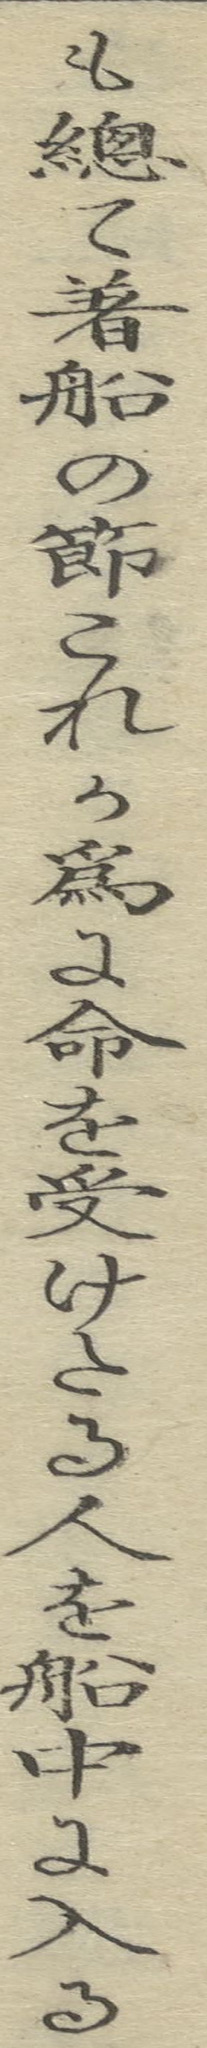も總て着船の節これか為に命を受けたる人を船中に入る
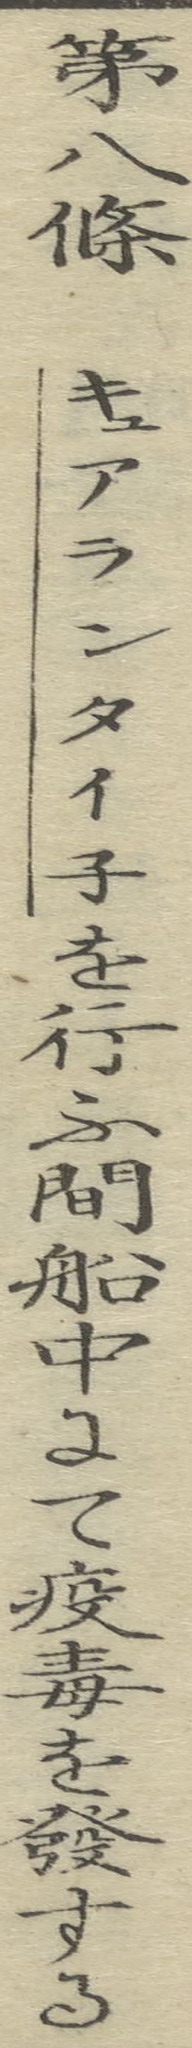大八條キュアランタイネを行ふ間船中にて疫毒を發する
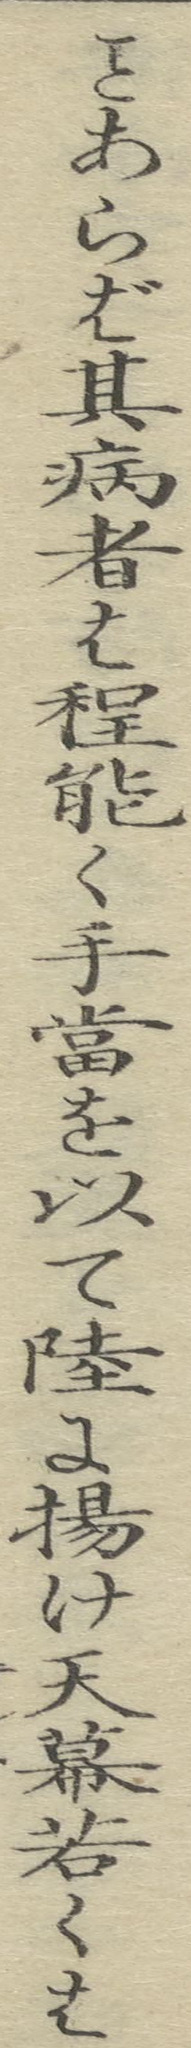ことあらば其病者は程能く手當を以て陸に揚け天幕若くは
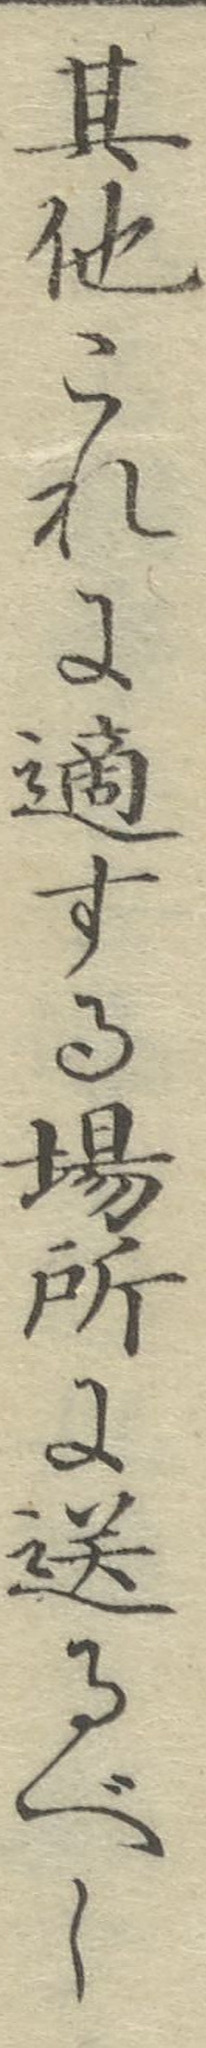其他これに適する場所に送るべし
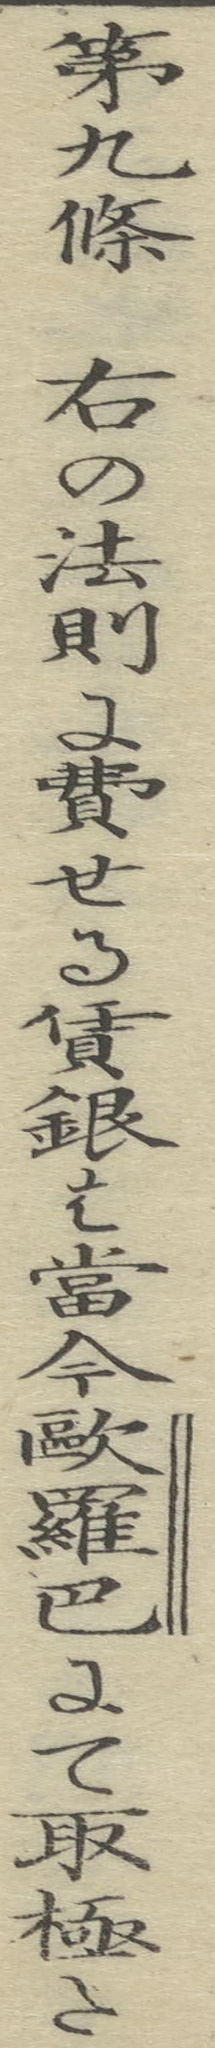第九條右の法則に費せる賃銀は當今欧羅生巴にて取極た
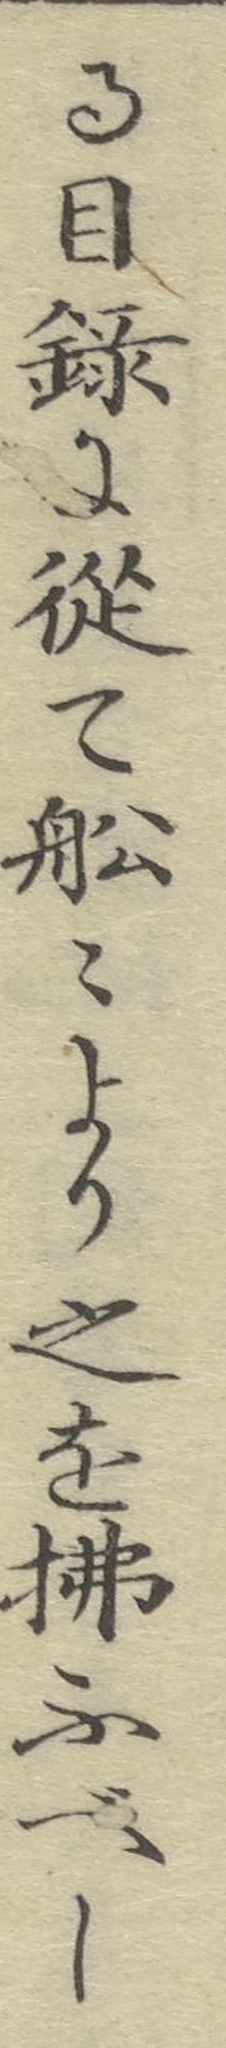る目録に従て舩々より之を拂ふべし

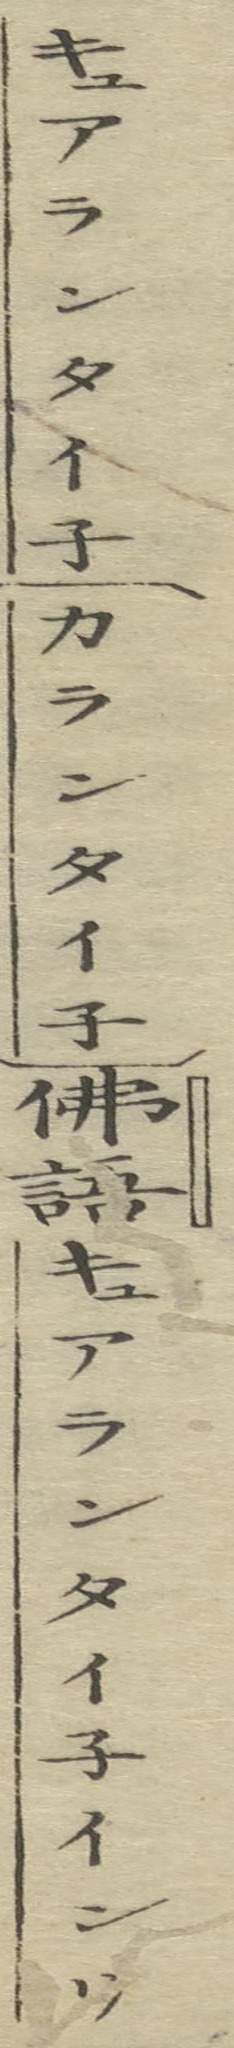キュアランタイネ[カランタイネ]佛語キュアランタイネインリ
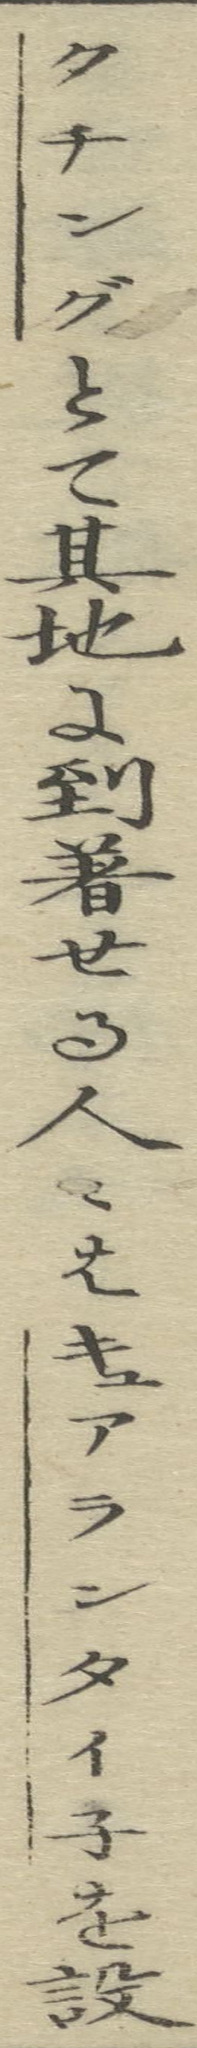クチングとて其他に到着せる人々はキュアランタイネを設
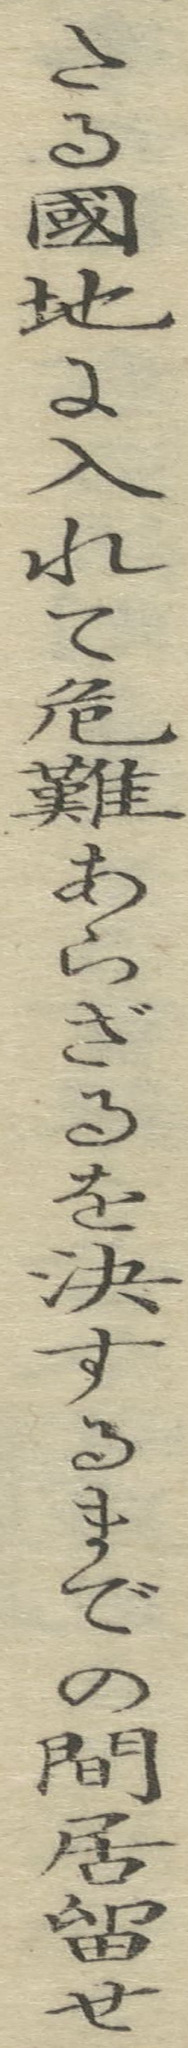たる國地に入れて危難あらざるを決するまでの間居留せ
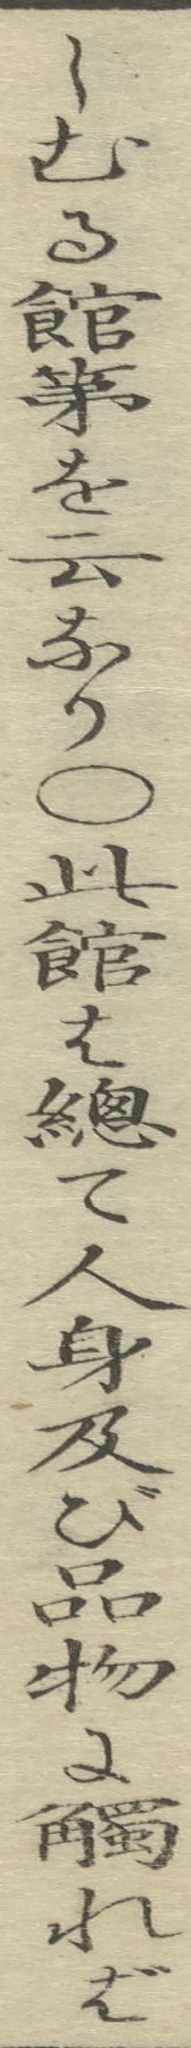しむる館第を云なり〇此館は總て人身及び品物に觸れば
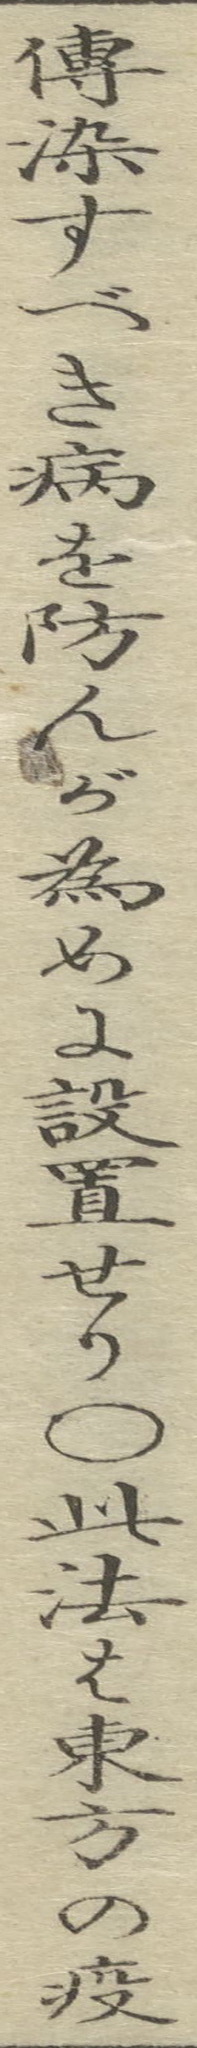傅染すべき病を防んが為めに設置せり〇此法は東方の疫
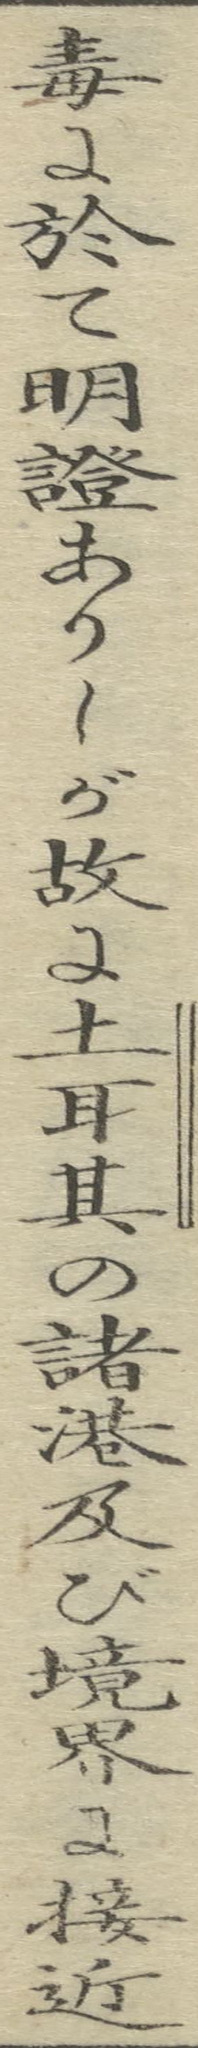毒に於て明澄ありしが故に土耳其の諸港及び境界に接近
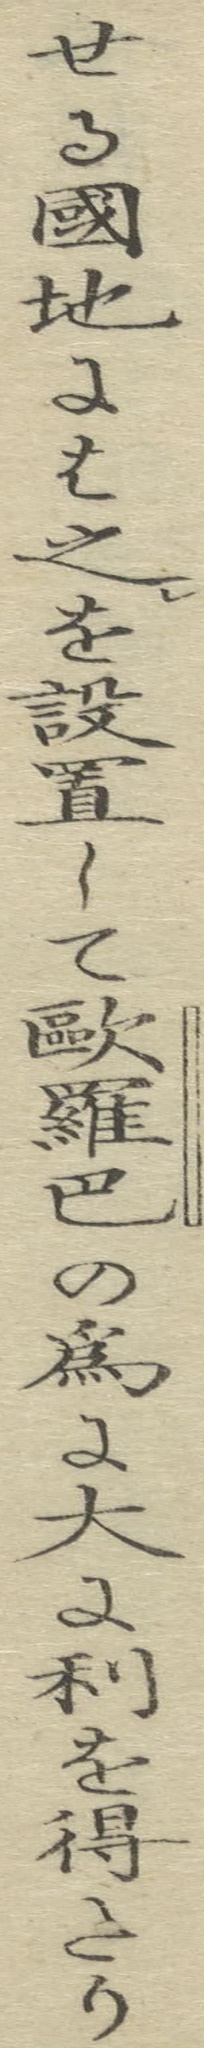せる國地には之設置して欧羅巴の為に大に利を得たり
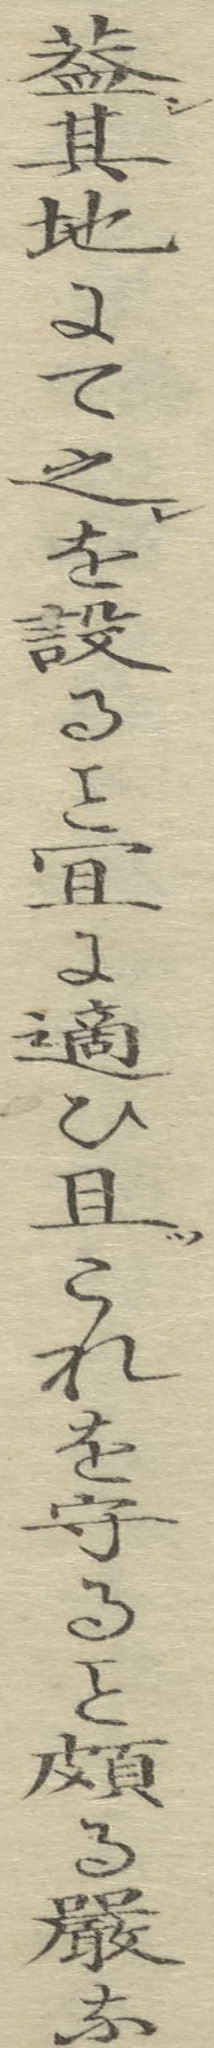葢其他にて之設ること冝に適ひ且守ること頗る厳な
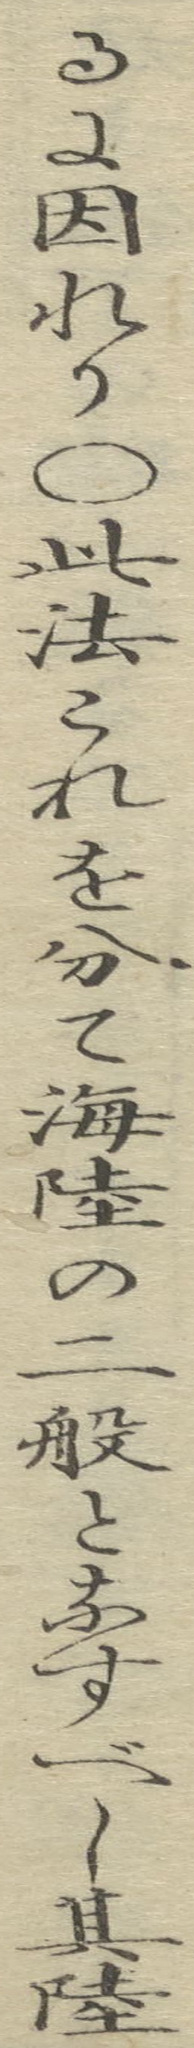るに因れり〇此法これを分て海陸の二般となすべし其陸
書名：官版疫毒預防説　全
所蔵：東京大学総合図書館 General Library in the University of Tokyo, JAPAN
